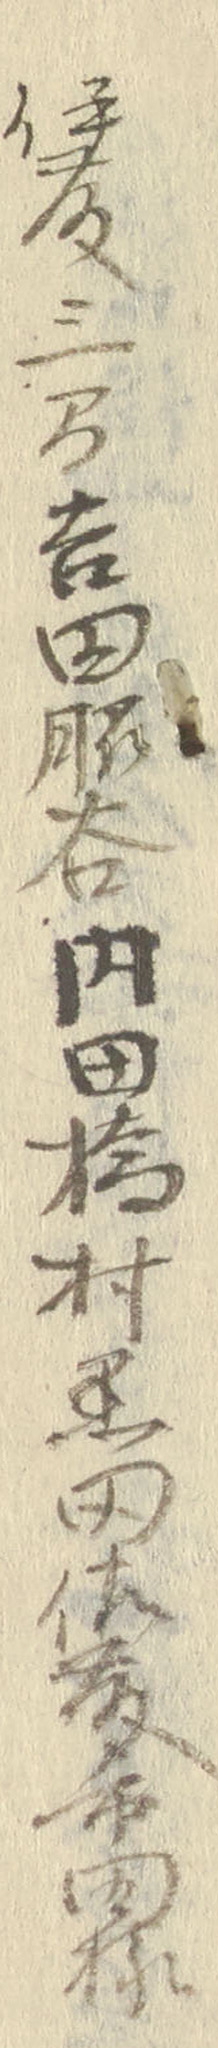伊藤三間吉田脇谷内田橋村黒田佐藤市田様
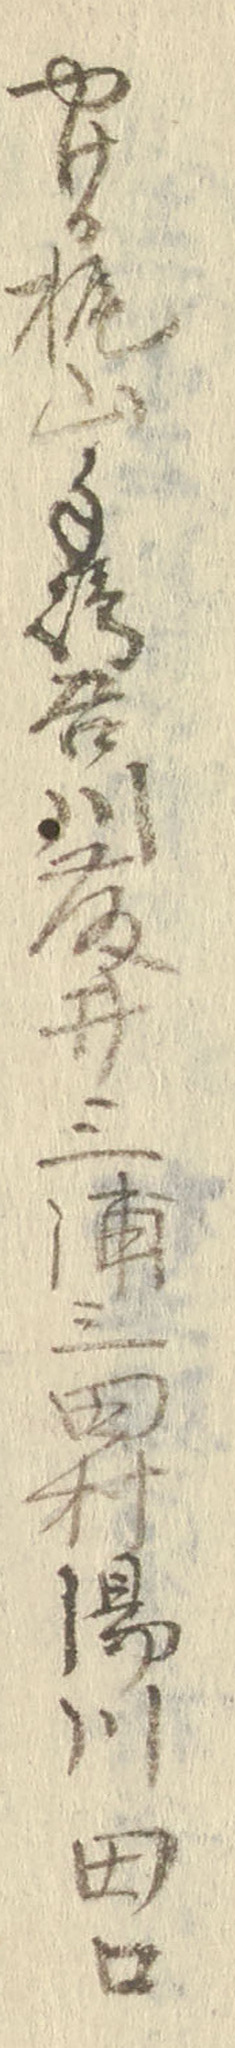やける梶山手嶋谷川藤井三浦三田村湯川田口
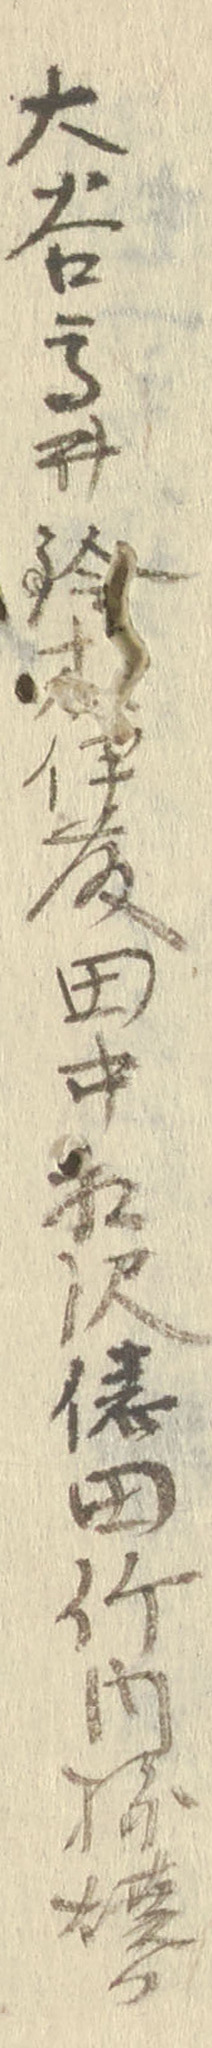大谷高井鈴木伊藤田中相沢俵田竹内様焼る
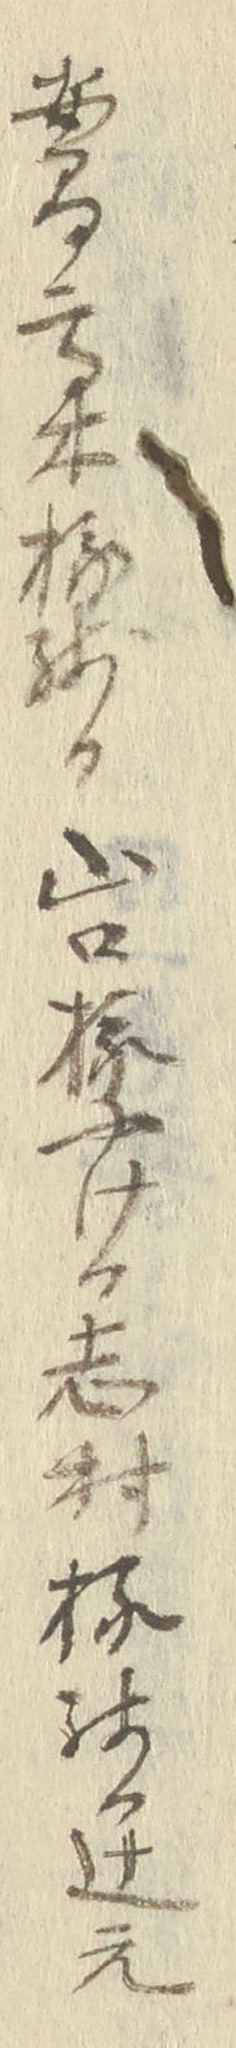安間高木様残る山口様やける志村様残る辻元
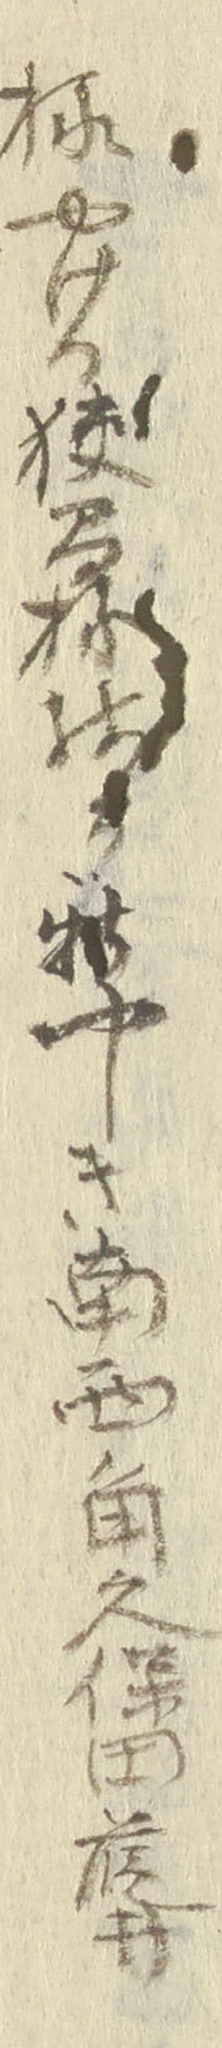様やける狭間様残る新やしき南西角久保田藤井
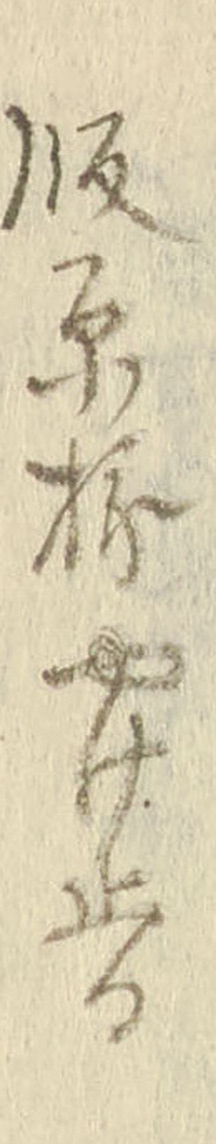飯原様やけ止る
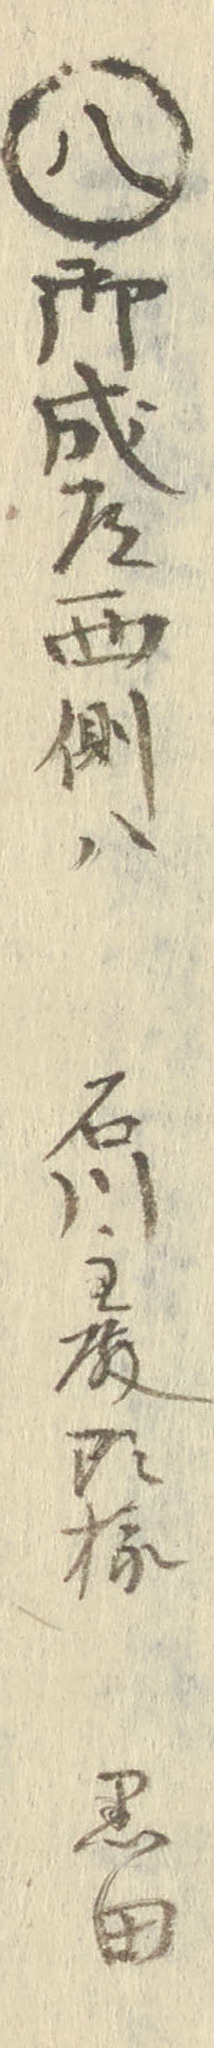八御成道西側ハ石川主殿頭様黒田
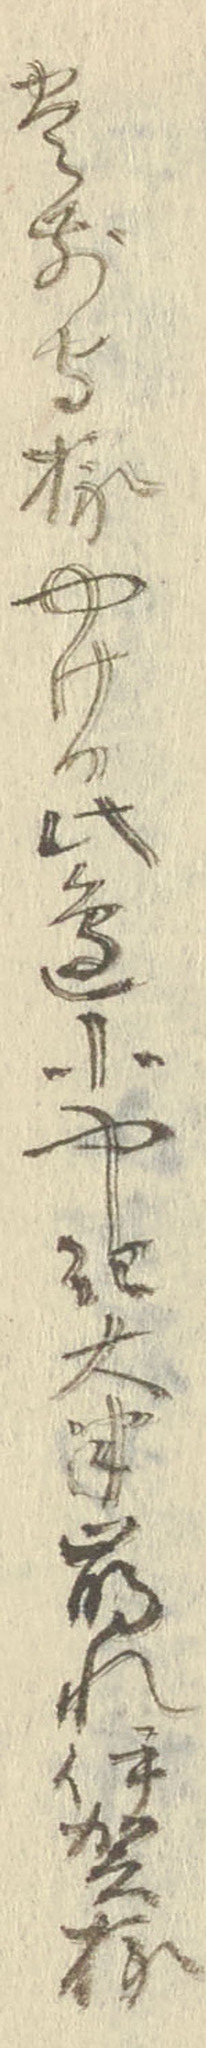豊前守様やける此邊小やしき大半崩れ伊賀様
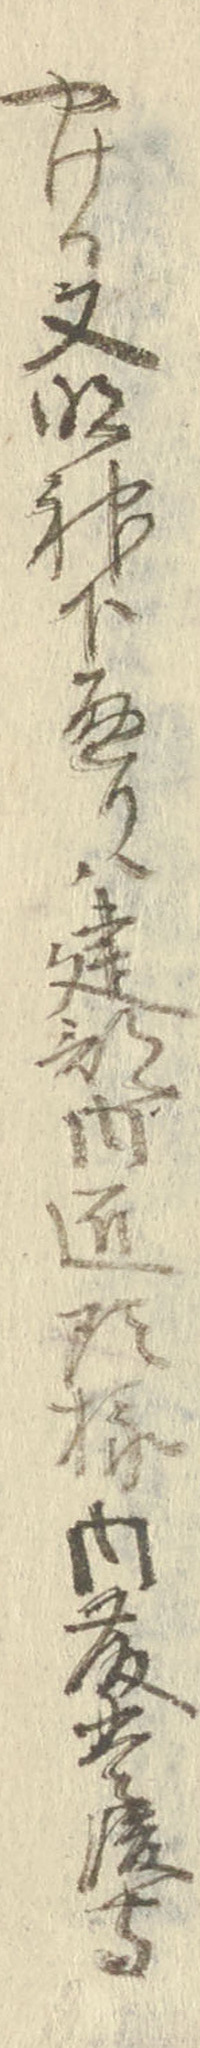やける又明神下通りハ建部内匠頭様内藤豊後守
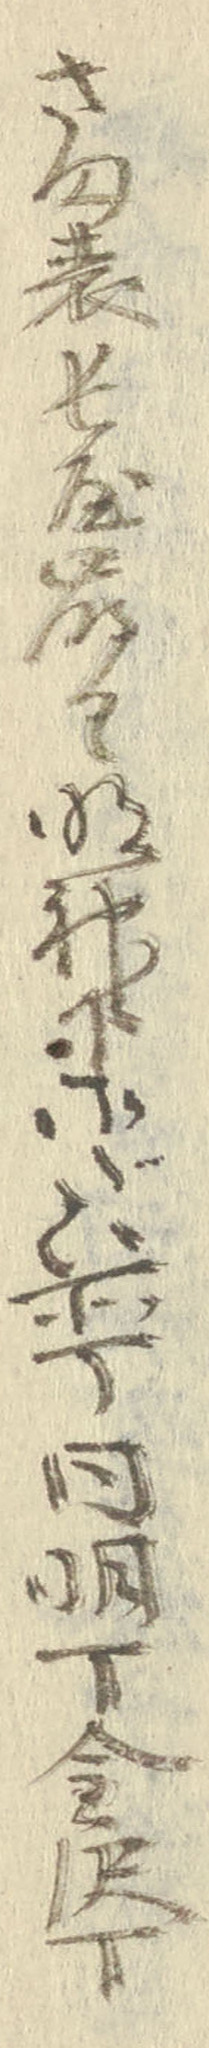さま表長屋崩るゝ明神下御だい所丁同朋丁金沢丁
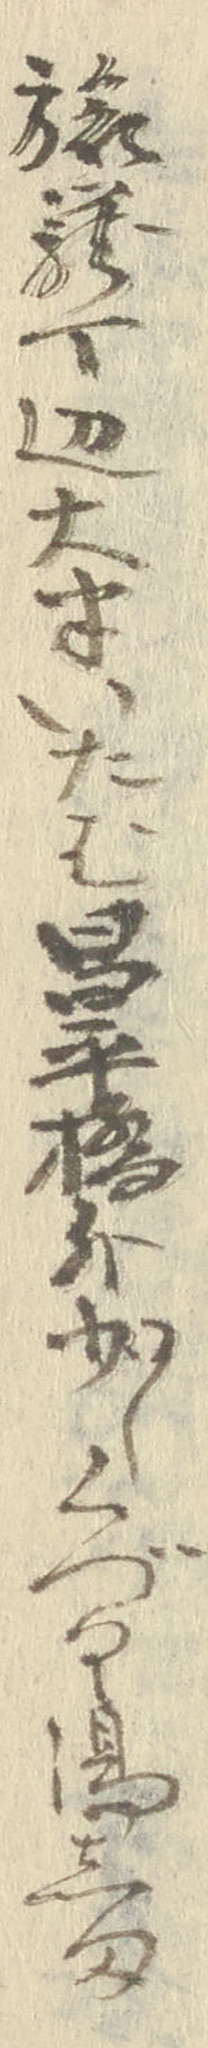旅籠丁辺大半いたむ昌平橋外少しくずるゝ湯しま
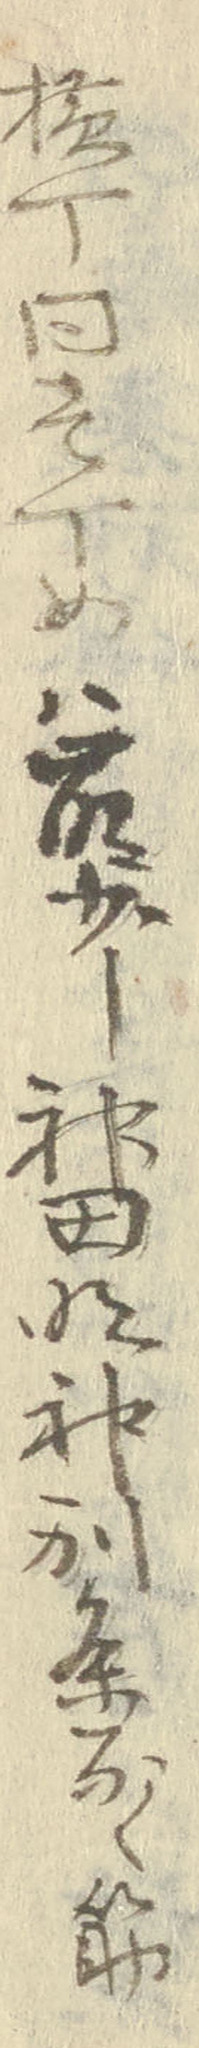横丁同壱丁めハ崩少し神田明神別条なく筋
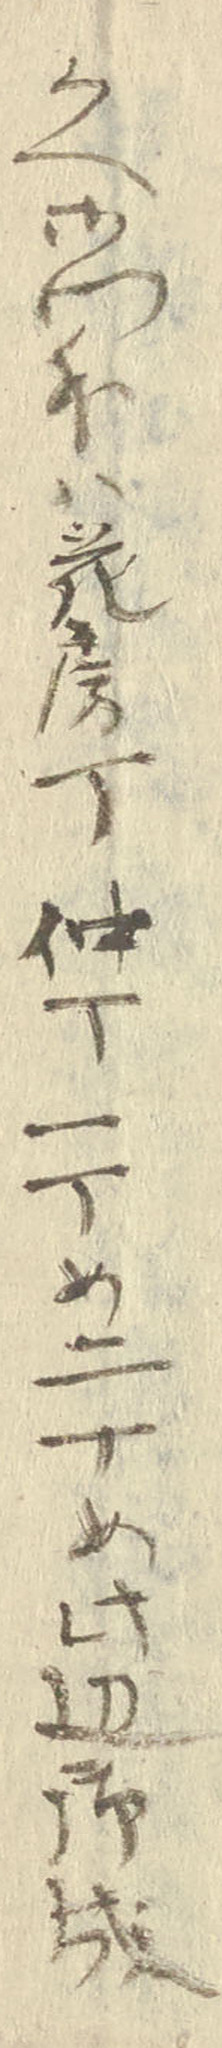かへ御門外ハ花房丁仲丁一丁め二丁め此辺御成
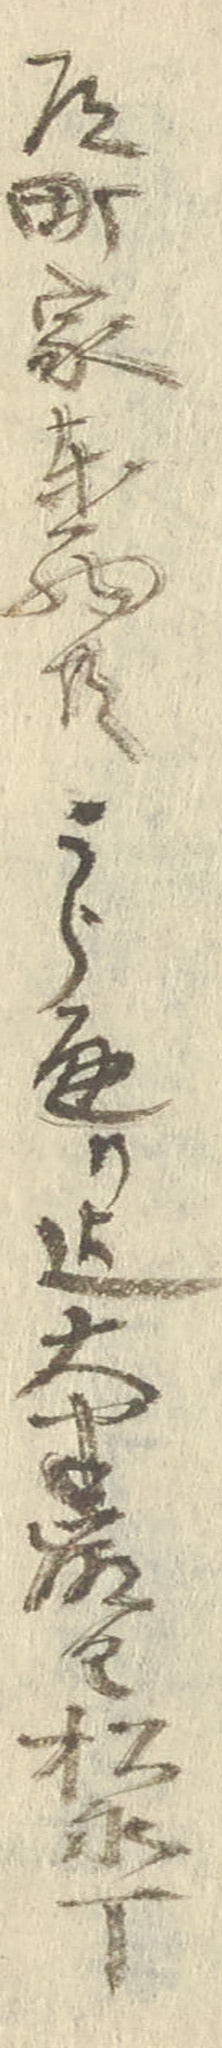道町家東西共うら通り迄大半崩るゝ松永丁
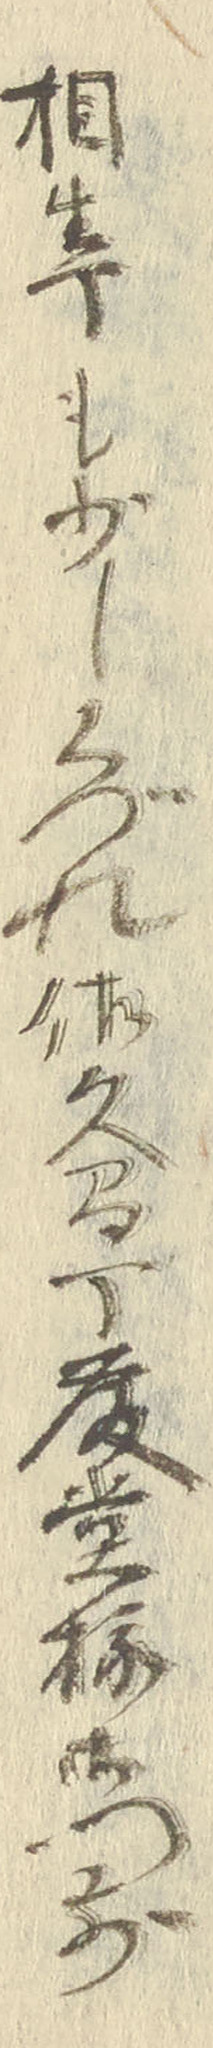相生丁も少しくづれ佐久間丁藤堂様御門前
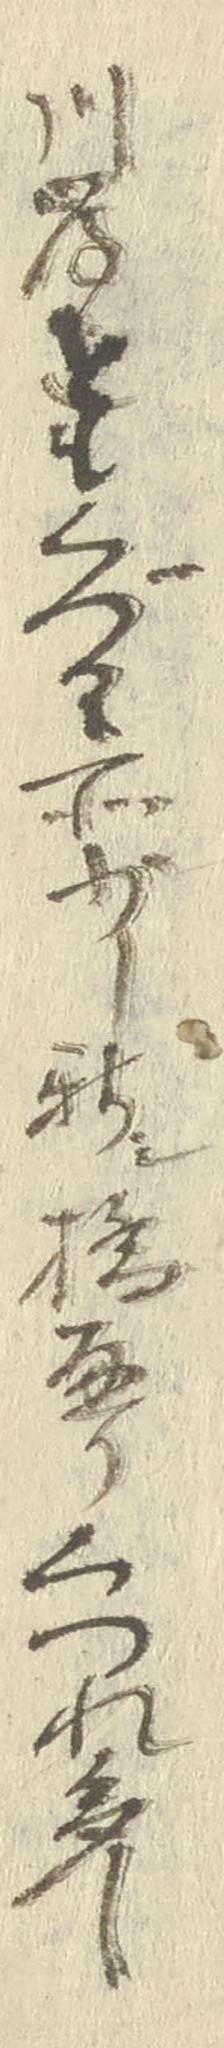川岸ともくずるゝ所少し新シ橋通りくつれ多し
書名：御府内御屋敷方市中共地震類焼場所明細書之冩兼街道筋近郷聞書
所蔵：東京大学総合図書館 General Library in the University of Tokyo, JAPAN
